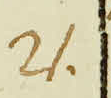21.
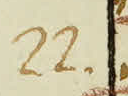22.
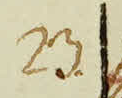23.
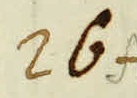26
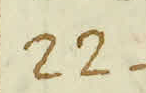22
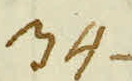34
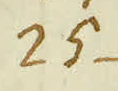25
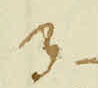3
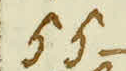55
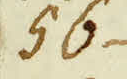56
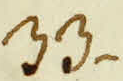33
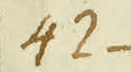42
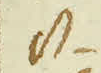8
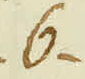6
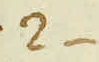2
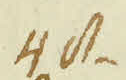48
